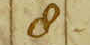8
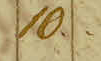10
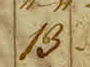13
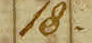18
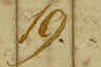19
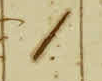1.
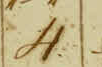4.
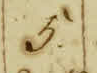5.
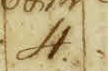4.
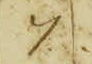7.
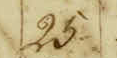25
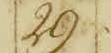29
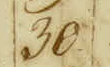30.
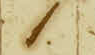1.
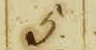5.
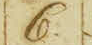6.
